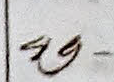49
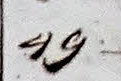49
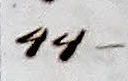44
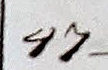47
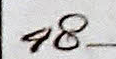48
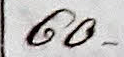60
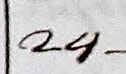24
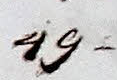49
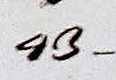43
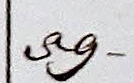59
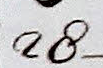28
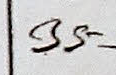35
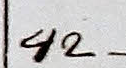42
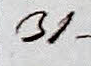31
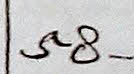58
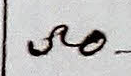50
